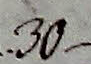30
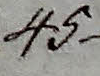45
